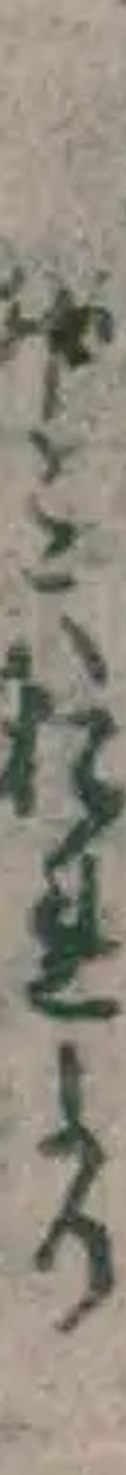おとこはおれより
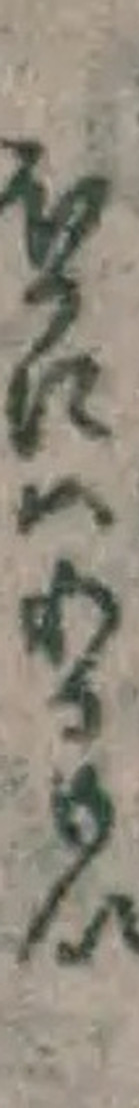ほかにはあるめい

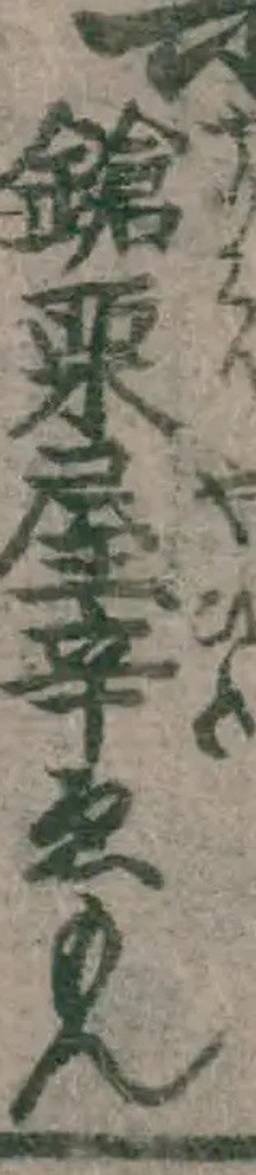鎗栗屋辛ゑもん
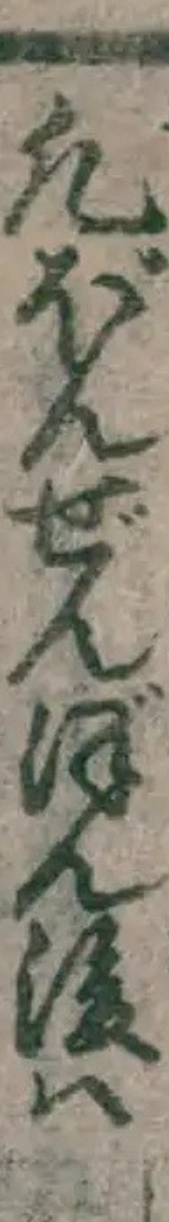凡ぼんぜんぼん後は
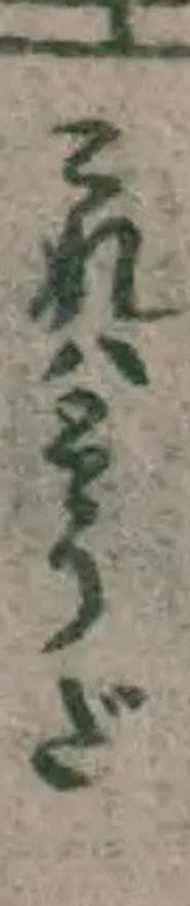これはとうだ
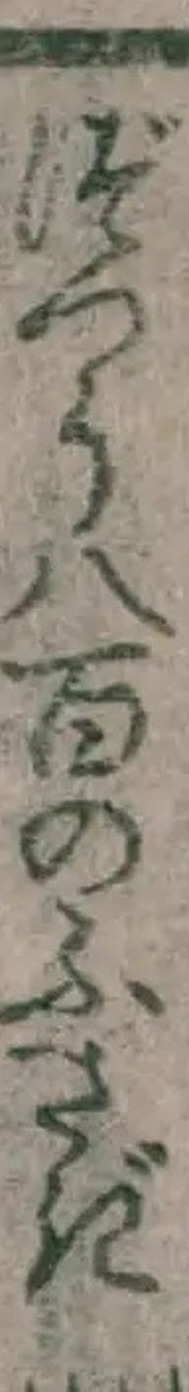づつう八百のふさぎ
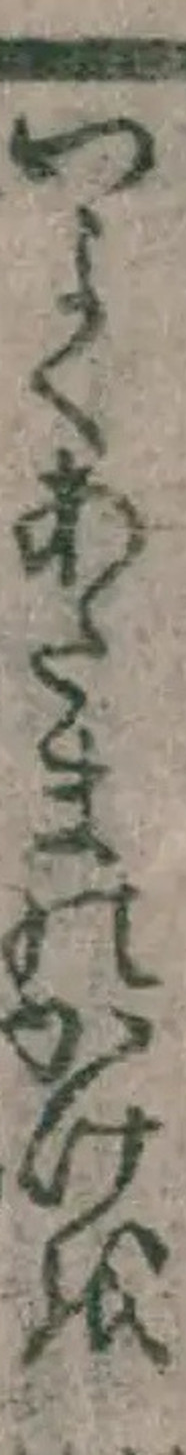つよくあたまのかけを
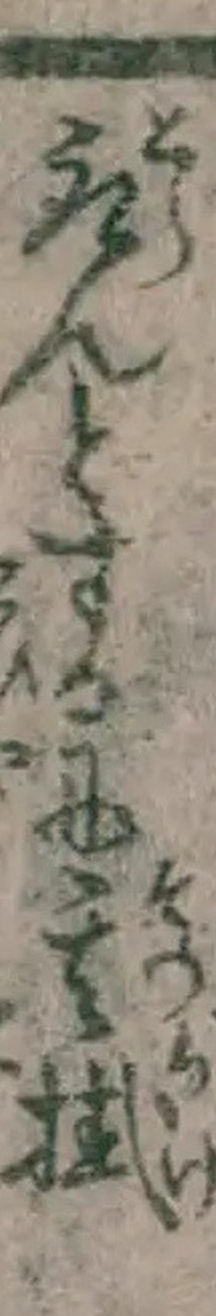取んとするに其掛
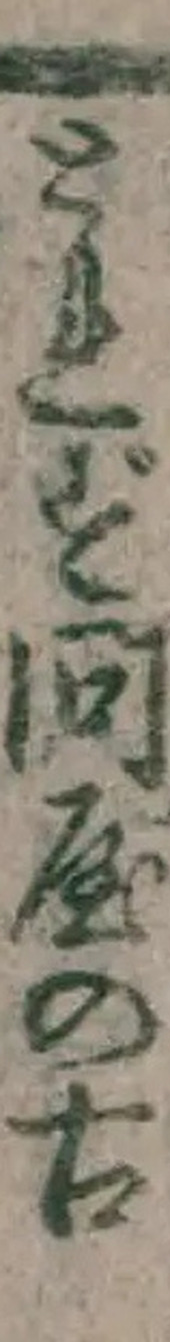とれず問屋の古
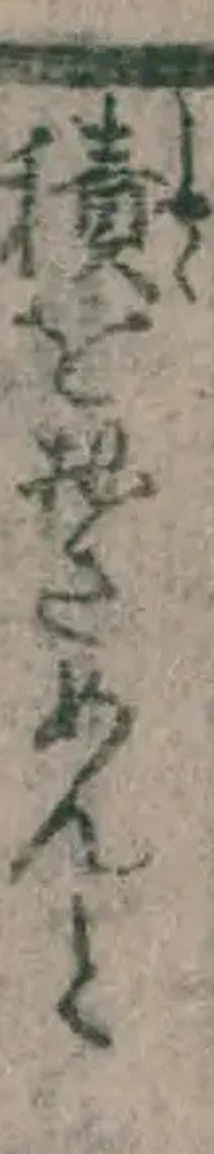積をおさめんと
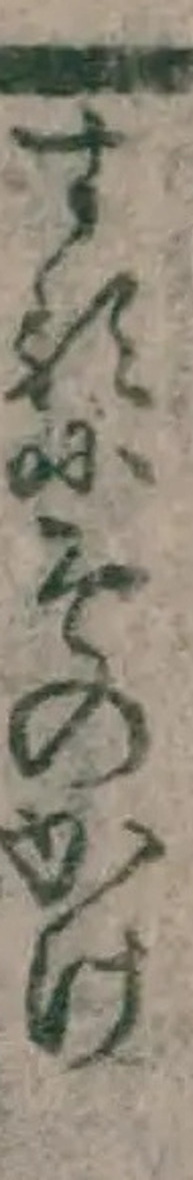するにそのかけ
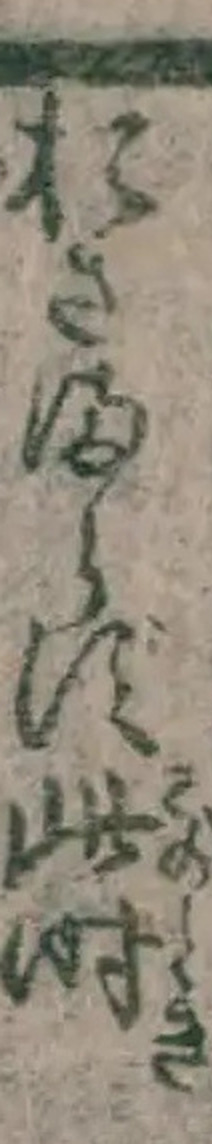おさまらず此時
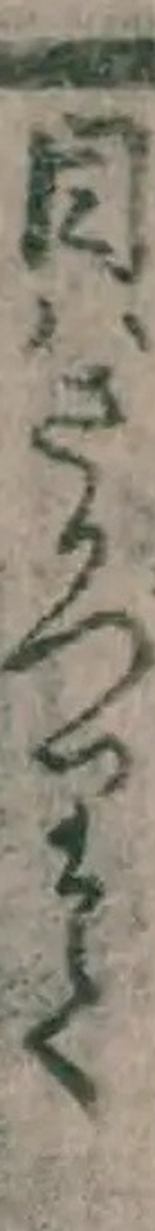目はさかづりて
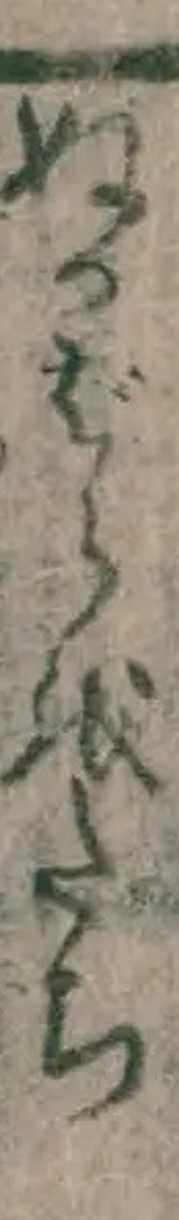ぬかばらをたち
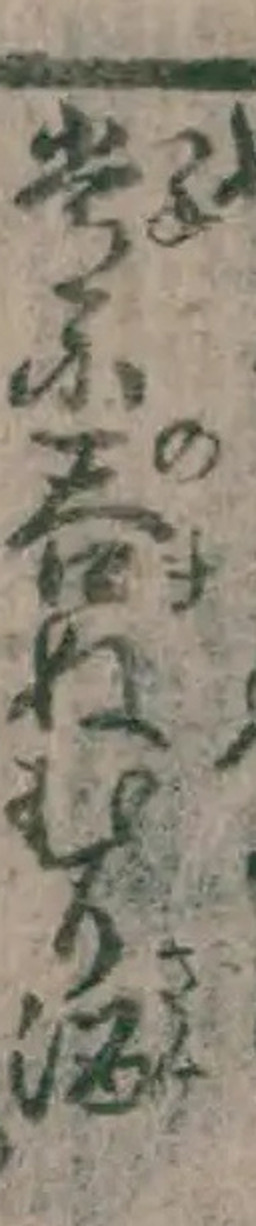常に呑ぬむり酒
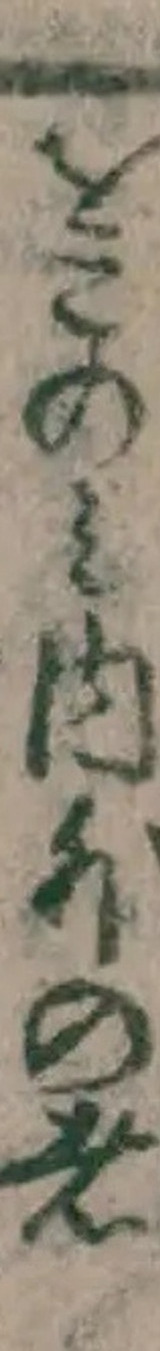をこのみ内外の者
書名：視薬霞報条 3巻
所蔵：国立国会図書館 National Diet Library, JAPAN
